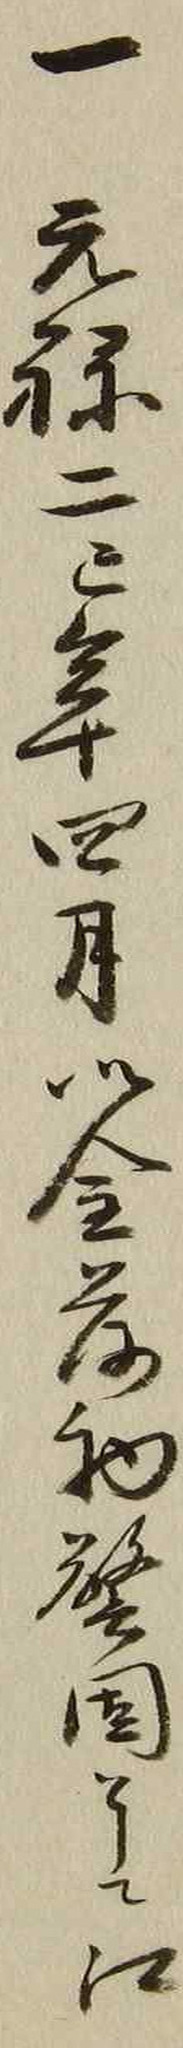一元禄二巳年四月御金荷物譬固として江
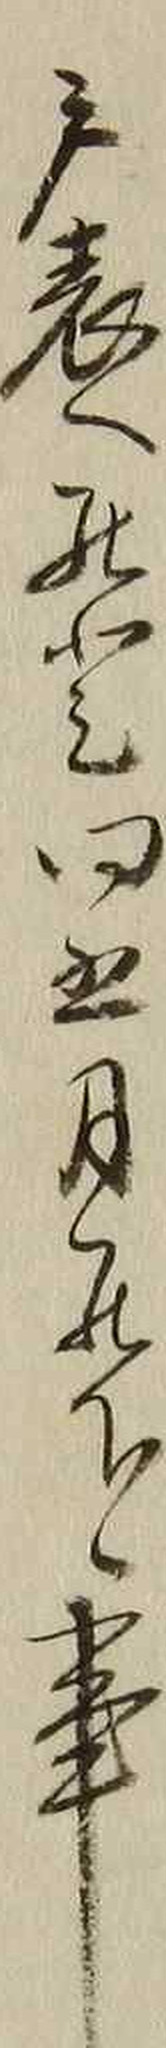戸表へ罷登同五月罷下候事
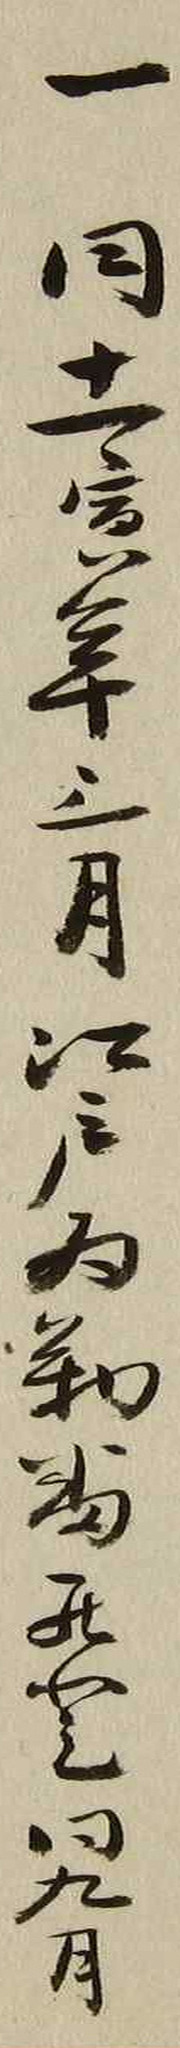一同十一寅年三月江戸為勤番罷登同九月
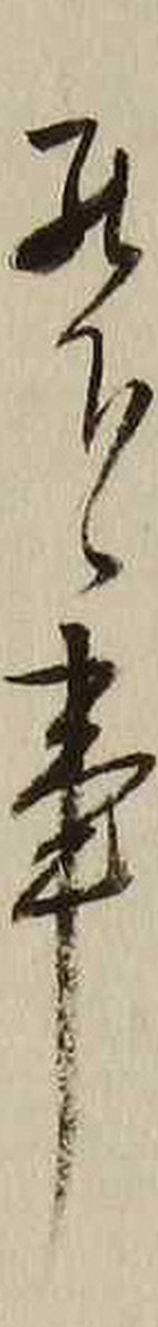罷下候事
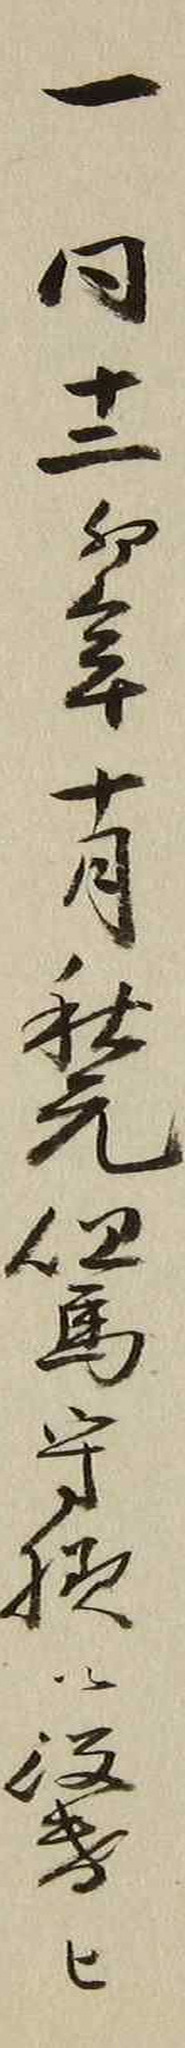一同十二卯年十月秋元但馬守様御役替被
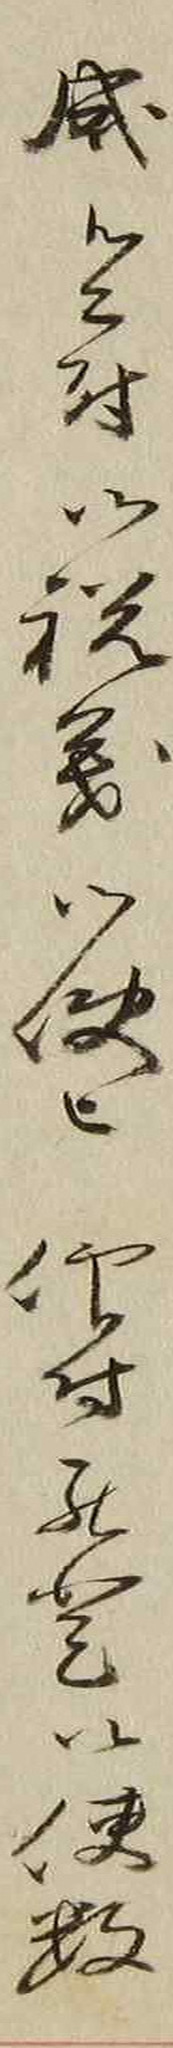成候ニ付御祝義御使被仰付罷登御使数
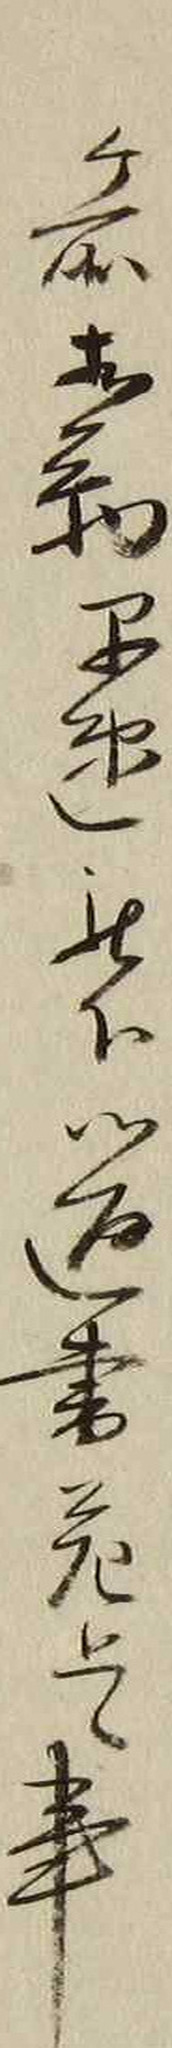ヶ所相勤早速罷下御返書差上候事
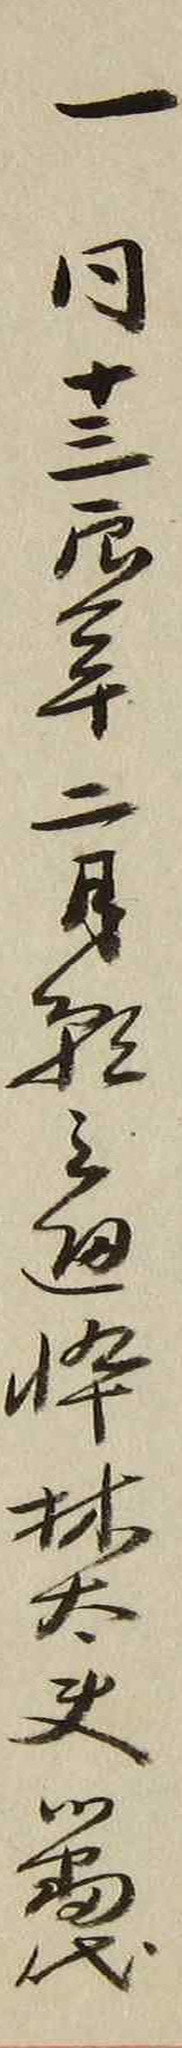一同十三辰年二月願之通忰林太夫御番代
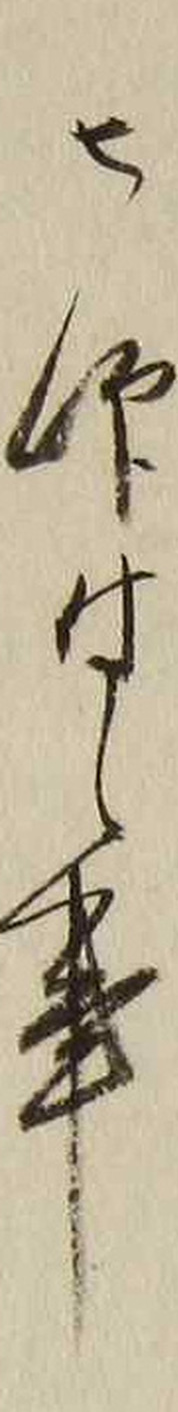被仰付候事
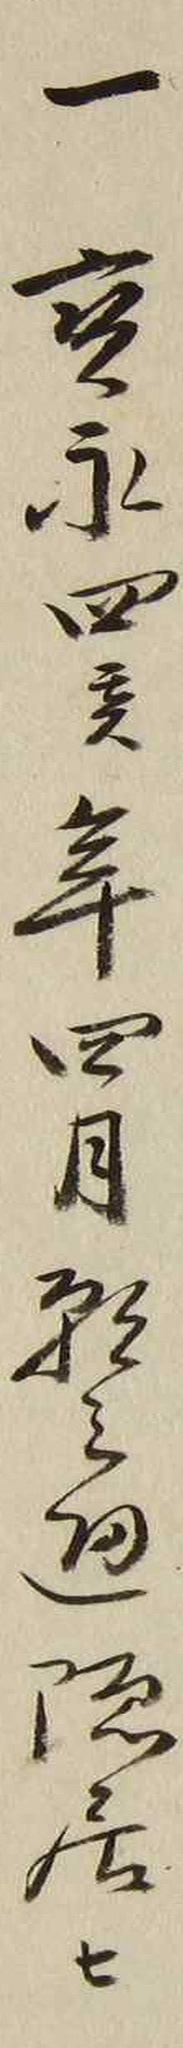一寛永四亥年四月願之通隠居被
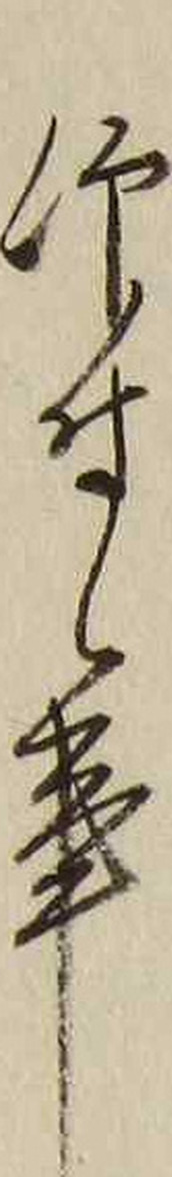仰付候事
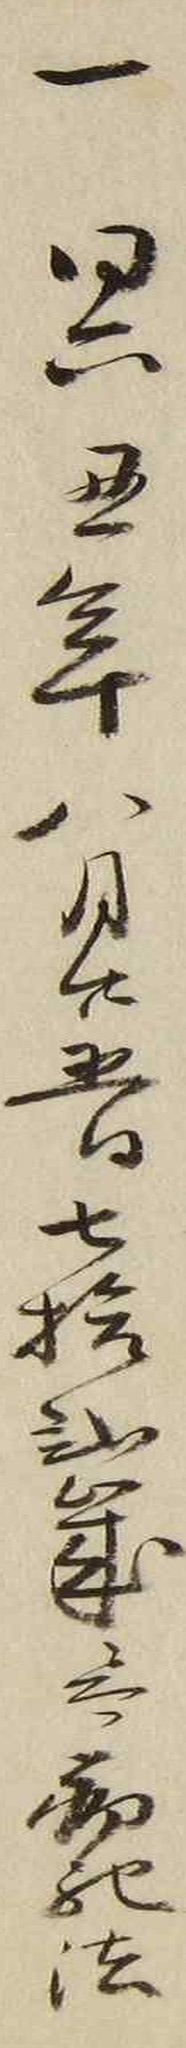一同六丑年八月廿五日七拾弐歳二而病死法

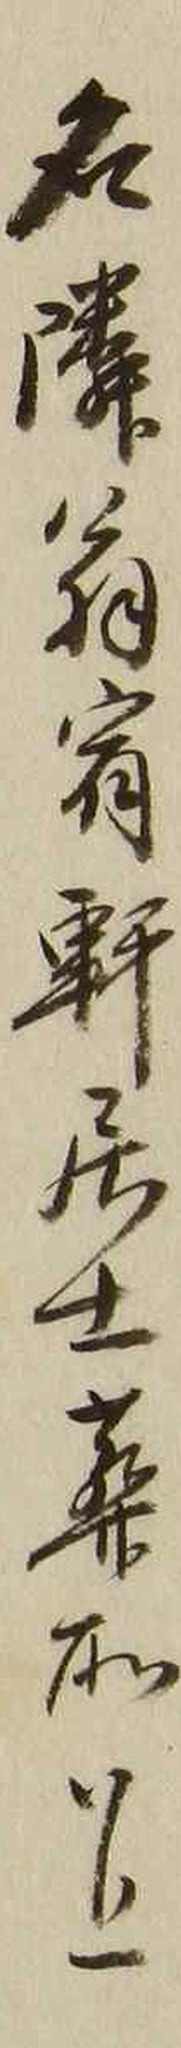名隣翁宿軒居士葬所同上
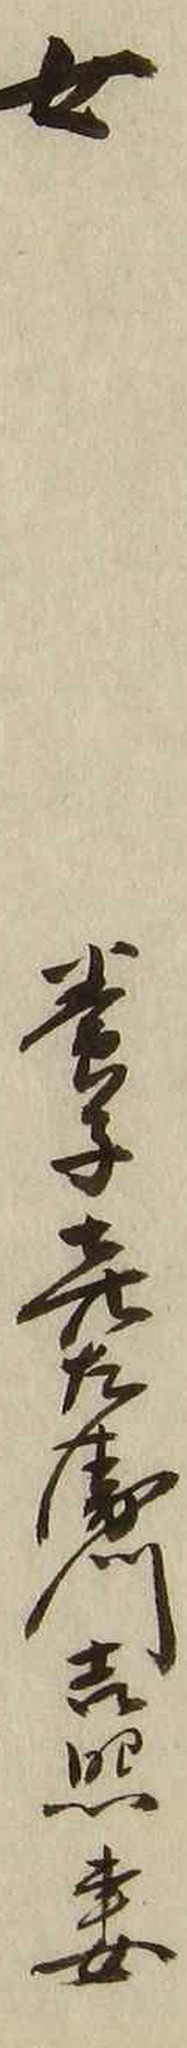女養子喜左衛門吉照妻
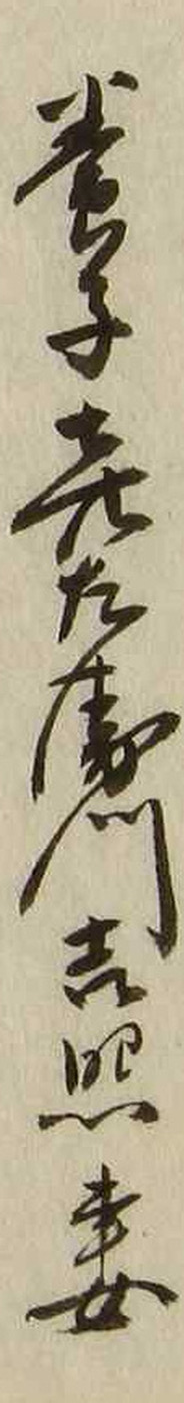女養子喜左衛門吉照妻
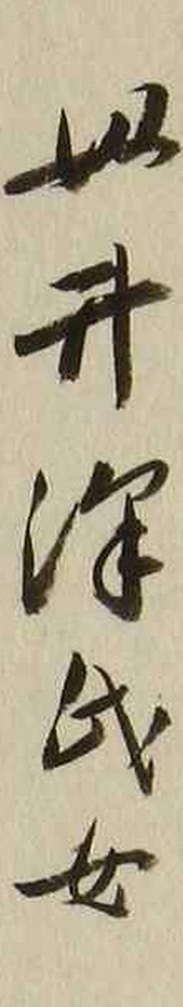母井沢氏女
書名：諸士系譜　巻之311　し之部1
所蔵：会津若松市立会津図書館
